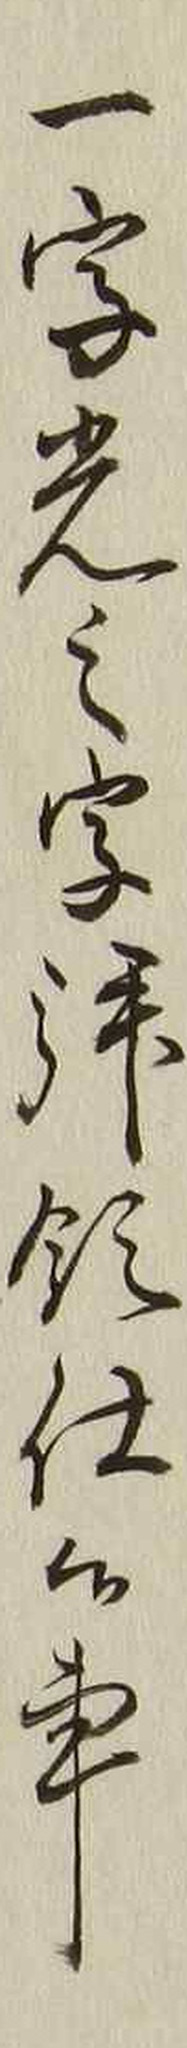一字光之字拝領仕候事
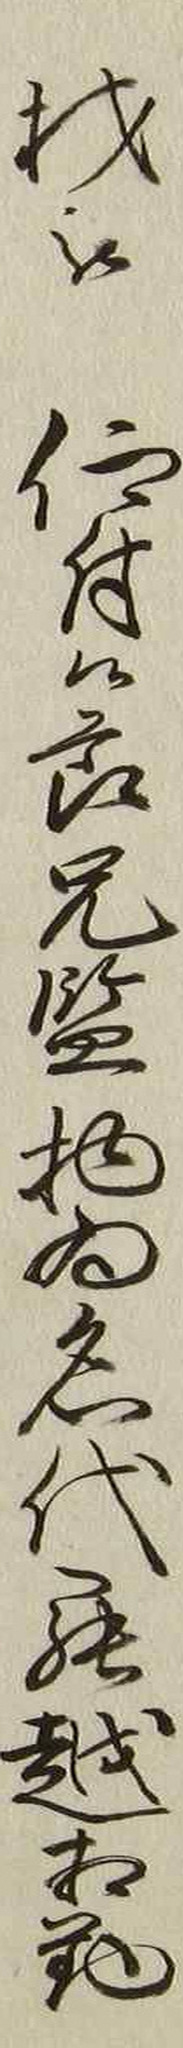材被仰付候節兄監物為名代罷越相勤
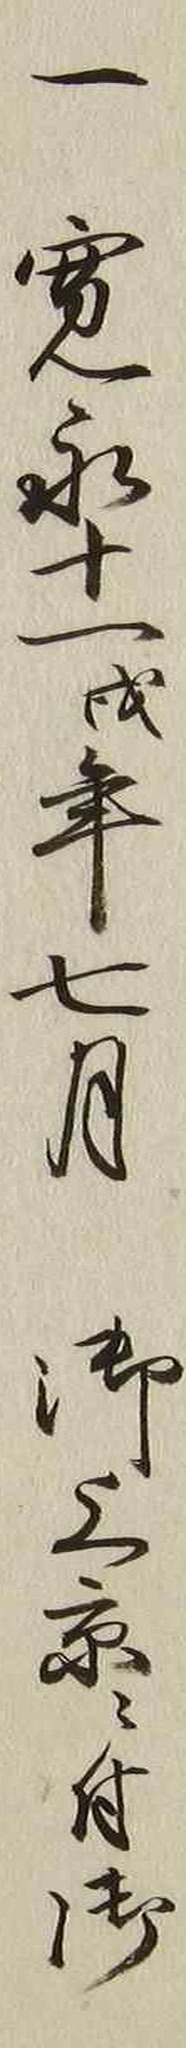一寛永十一戌年七月御上京ニ付御
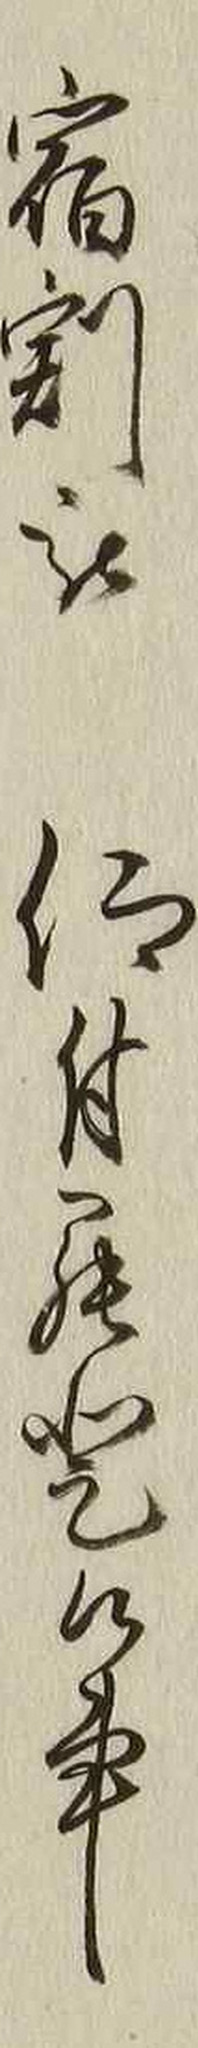宿割被仰付罷登候事
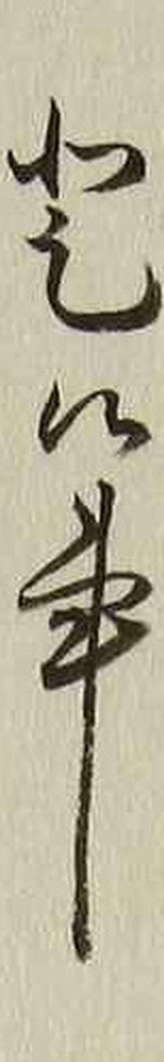登候事
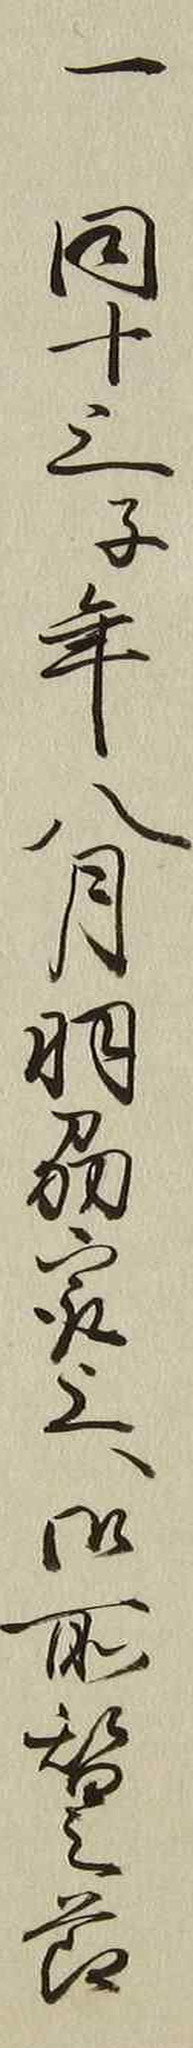一同十三子年八月羽州最上へ御所替之節
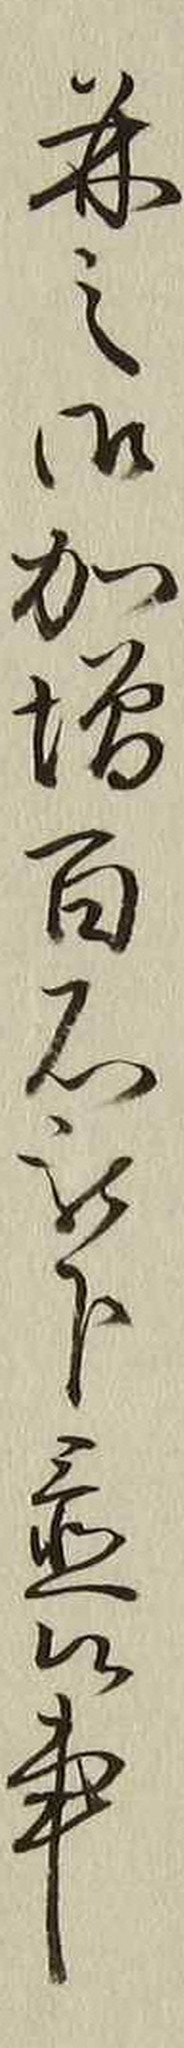再之御加増百石被下置候事
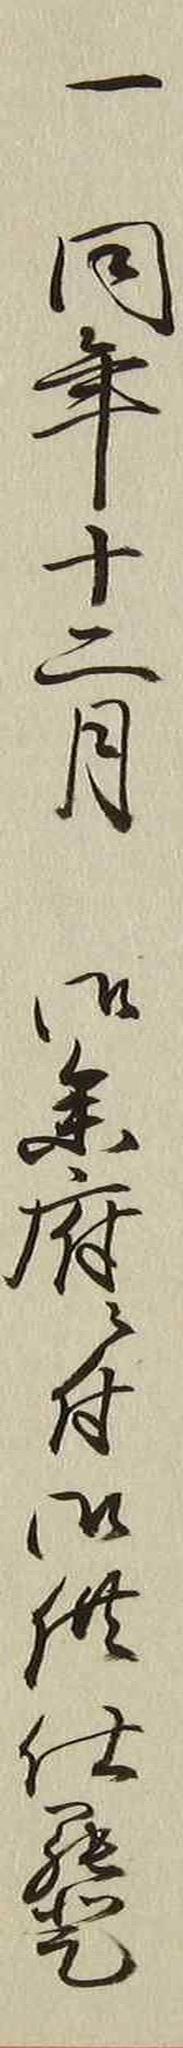一同年十二月御参府ニ付御供仕罷登
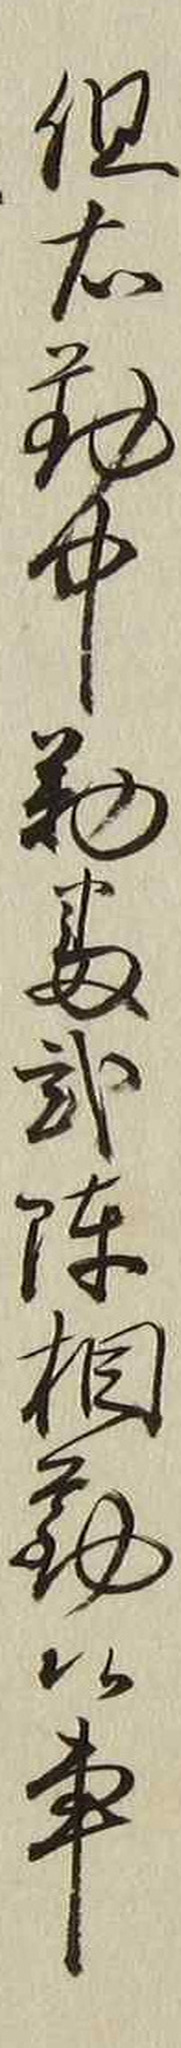但右勤中勤番弐陣相勤候事
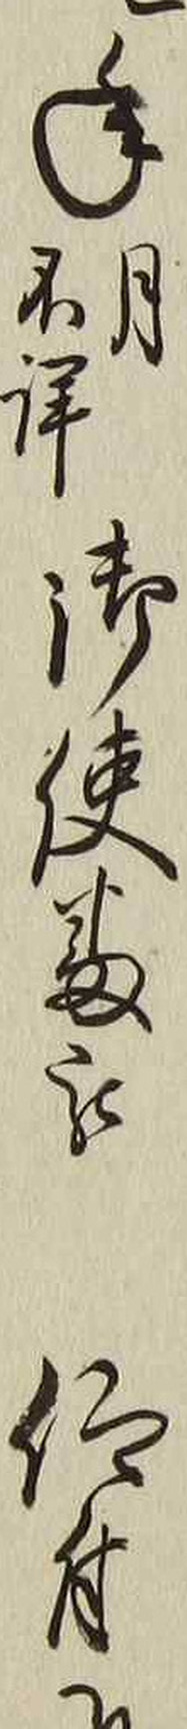不詳御供番被仰付候
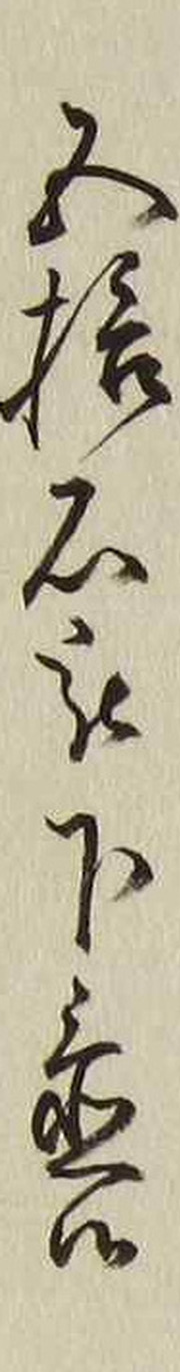五拾石被下置候
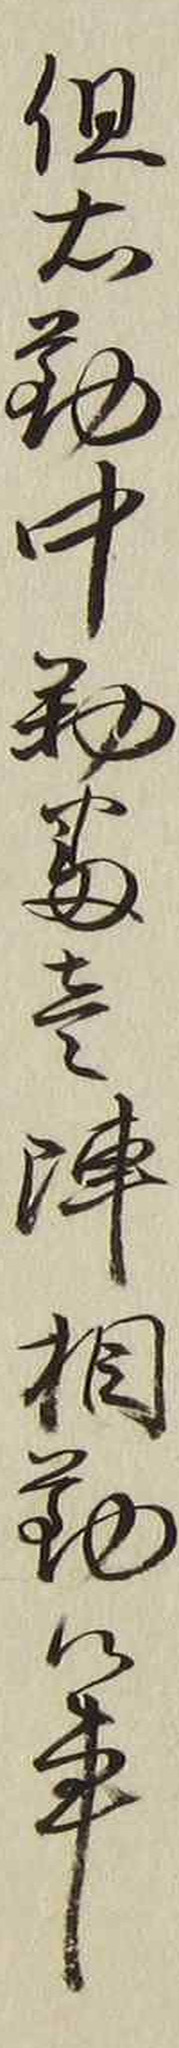但右勤中勤番壱陣相勤候事
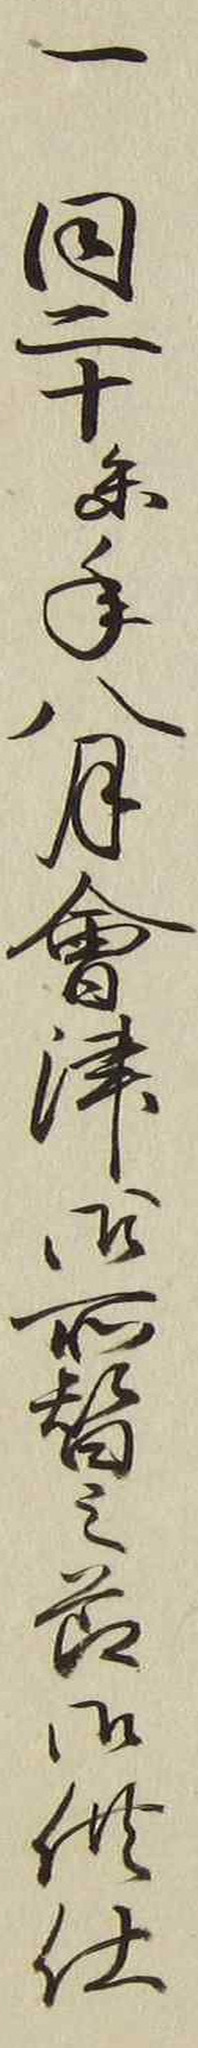一同二十未年八月会津へ御所替之節御供仕

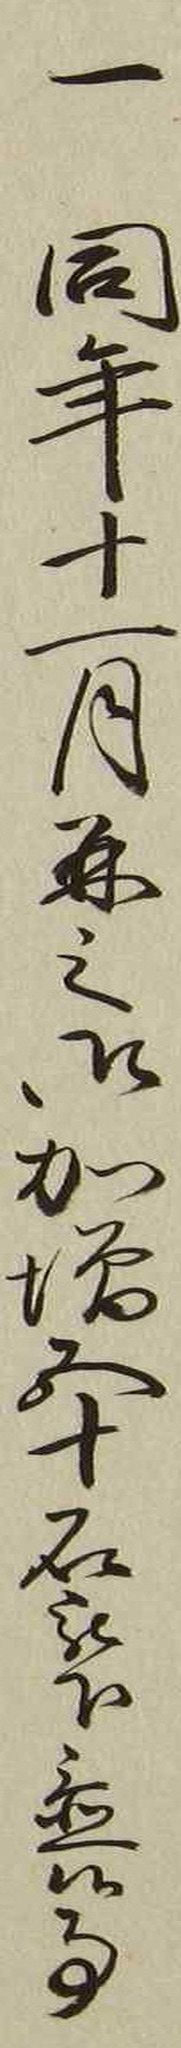一同年十一月再之御加増五十石被下置候事
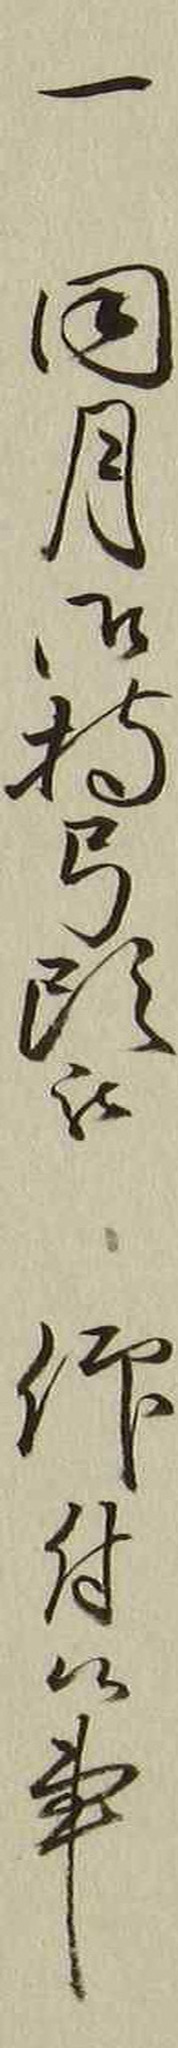一同月御持弓頭被仰付候事
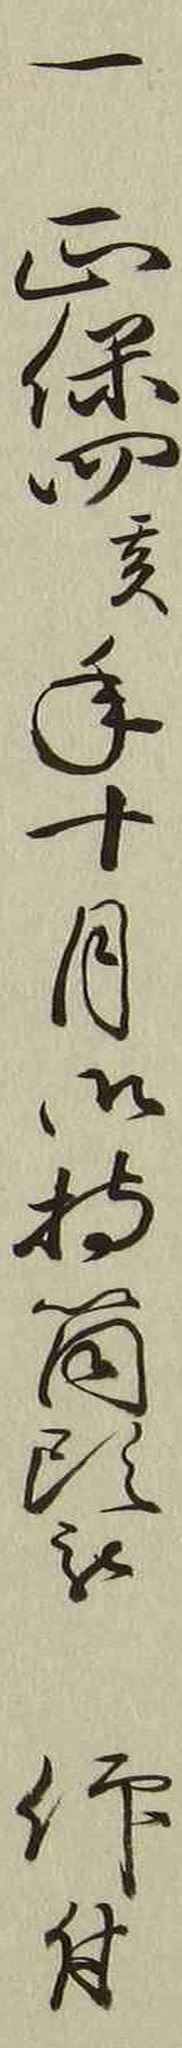一正保四亥年十月御持筒頭被仰付
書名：諸士系譜　巻之21　い之部21
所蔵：会津若松市立会津図書館
